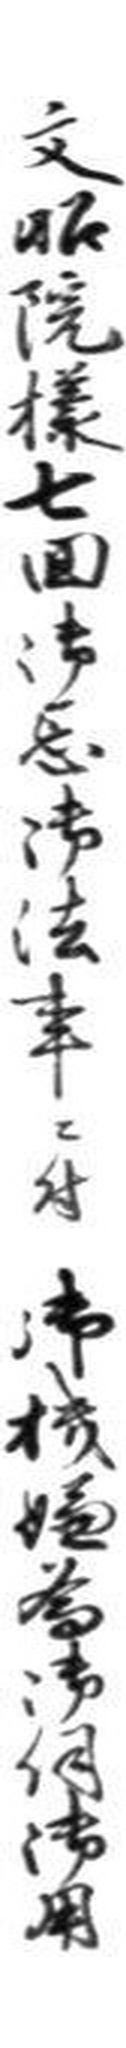文昭院様七回御忌御法事ニ付御機嫌為御伺御用
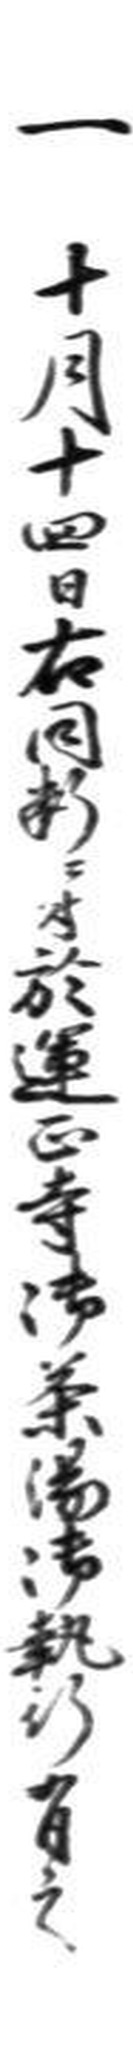一十月十四日右同断ニ付於運正寺御茶湯御執行有之
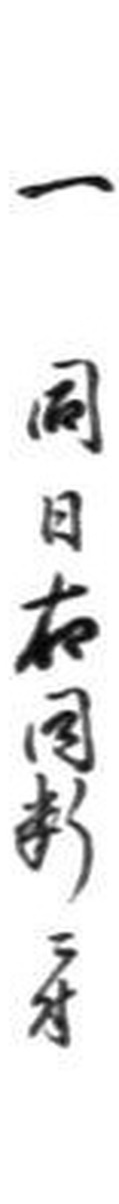一同日右同断ニ付
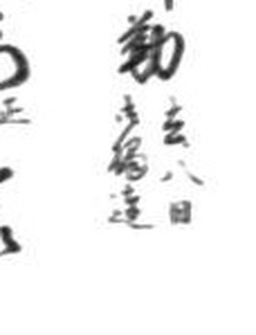御触達
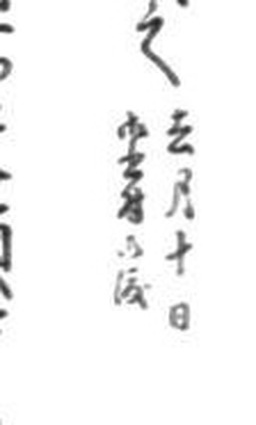御書付御渡
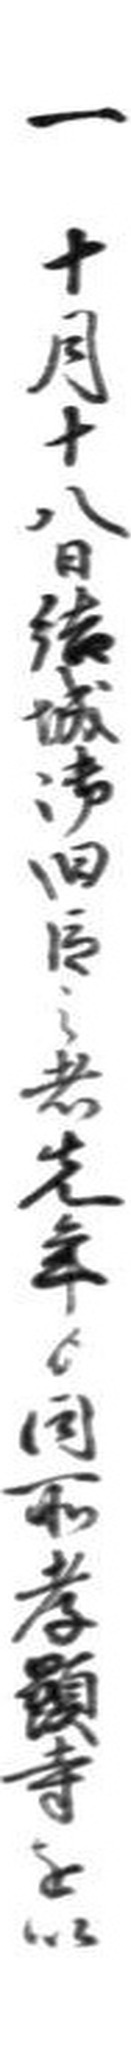一十月十八日結城御旧臣之者先年ゟ同所孝顕寺を以
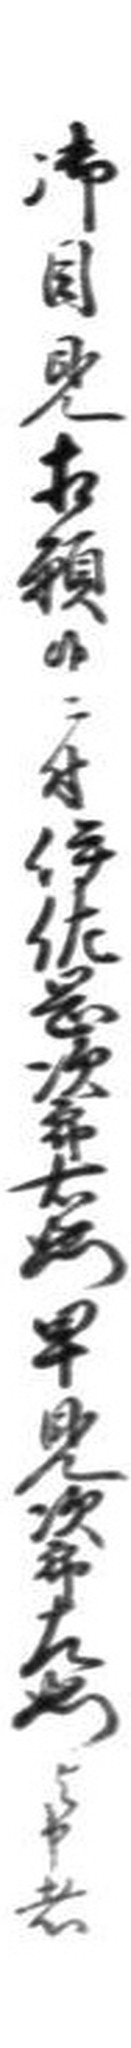御目見相願候ニ付伊佐岡次郎右衛門早見次郎左衛門与申者
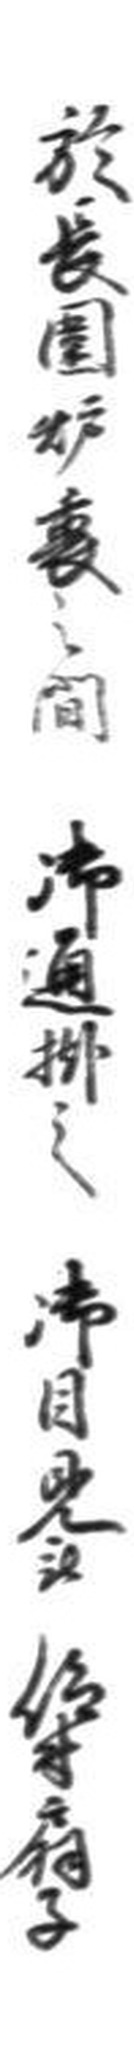於長囲炉裏之間御通掛之御目見被仰付扇子

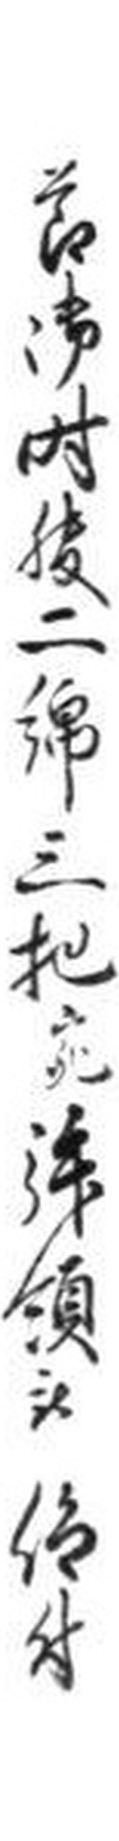節御時服二綿三把宛拝領被仰付
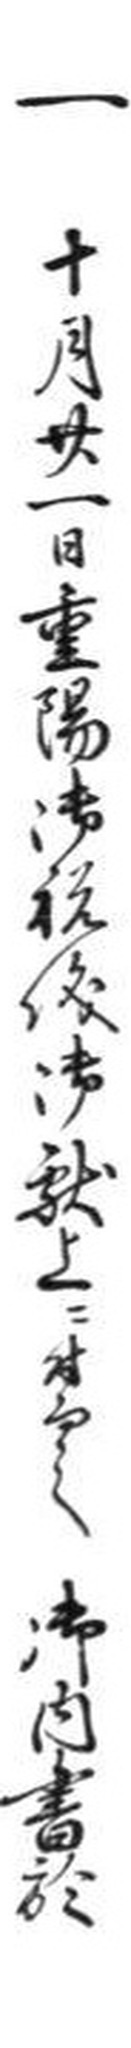一十月廿一日重陽御祝儀御献上ニ付而之御内書於
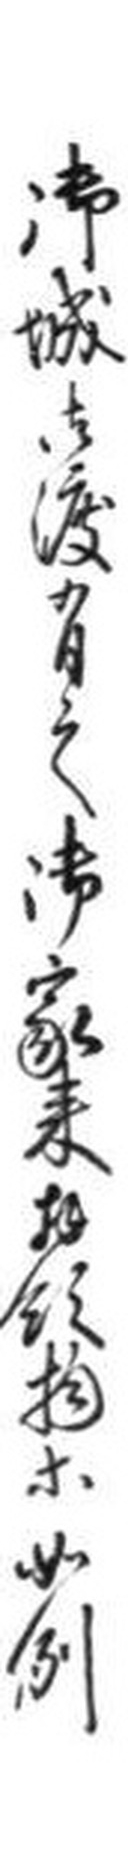御城御渡有之御家来拝領物等如例
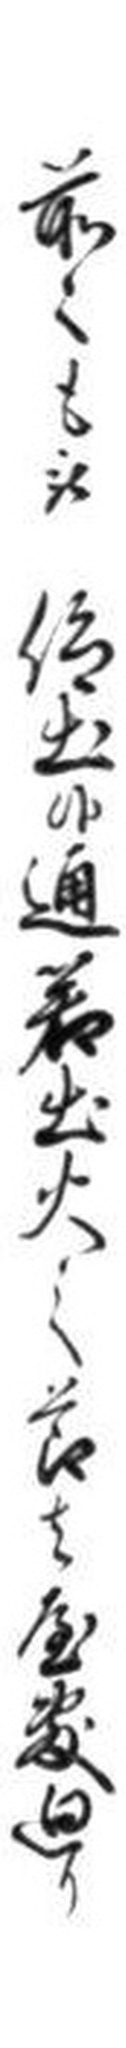前々も被仰出候通若出火之節者屋敷廻り
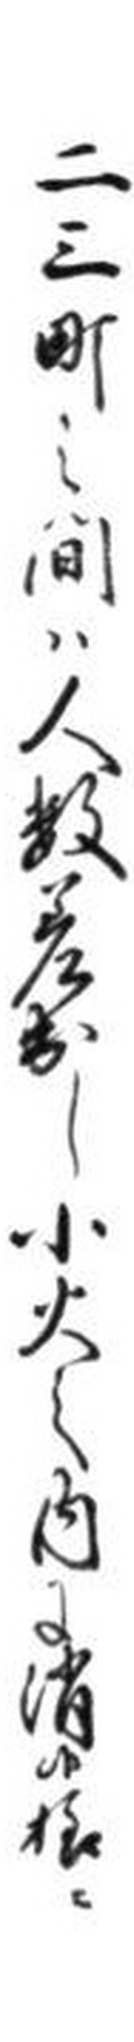二三町之間ハ人数差出し小火之内に消候様ニ
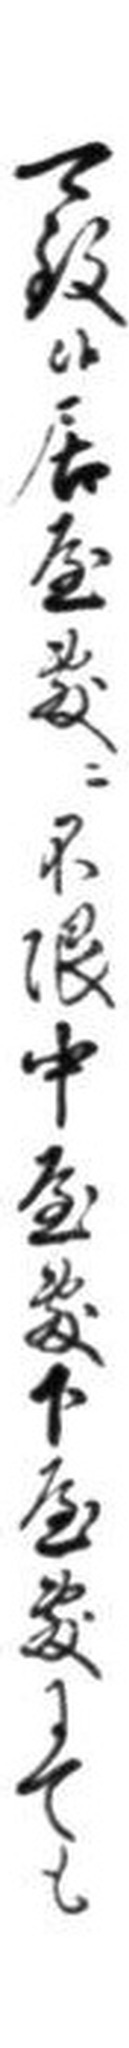可致候居屋敷ニ不限中屋敷下屋敷にても
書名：家譜 三十二 吉邦公 従享保二年到享保三年
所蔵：福井県文書館 Fukui Prefectural Archives
